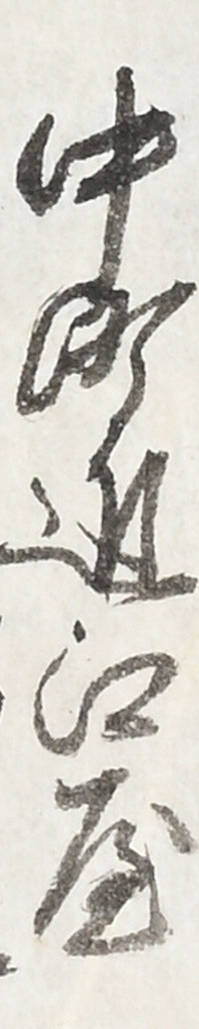中町近江屋
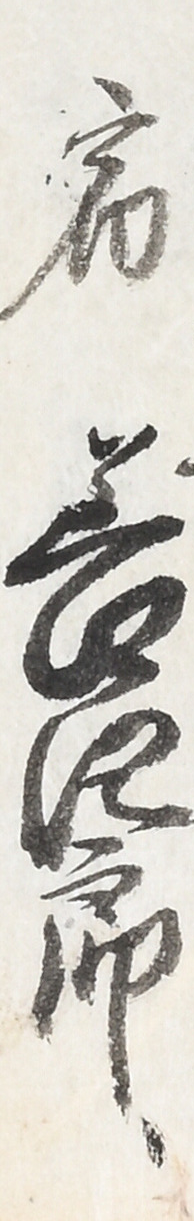宿善四郎
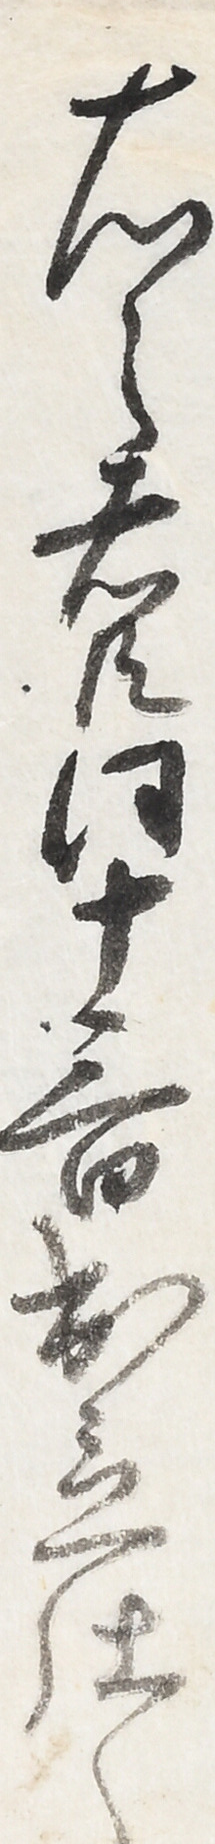右之者共同十三日出立仕候
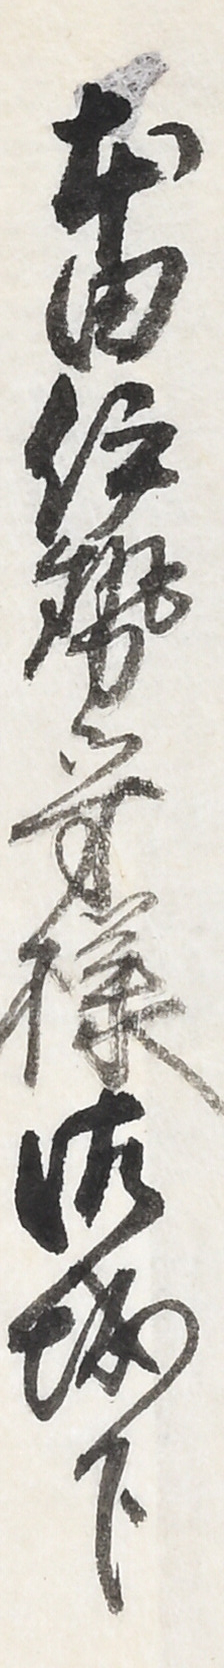本田伊勢守様御城下
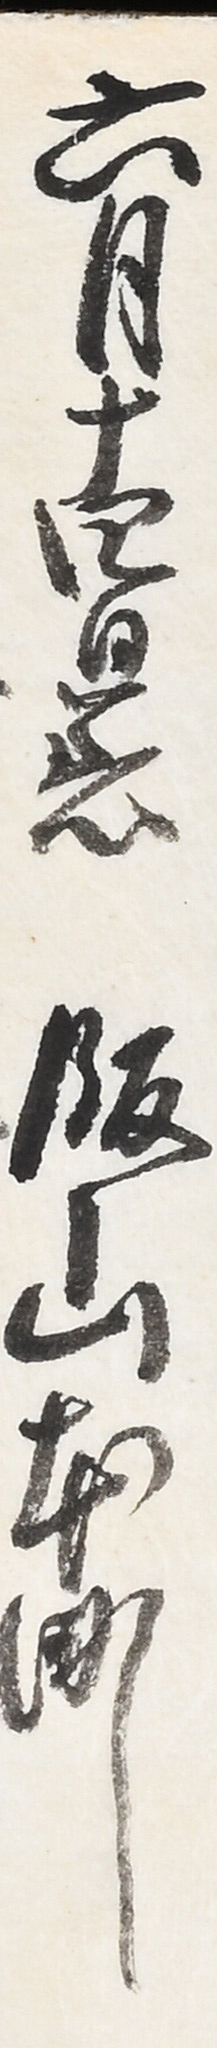六月十四日着飯山本町
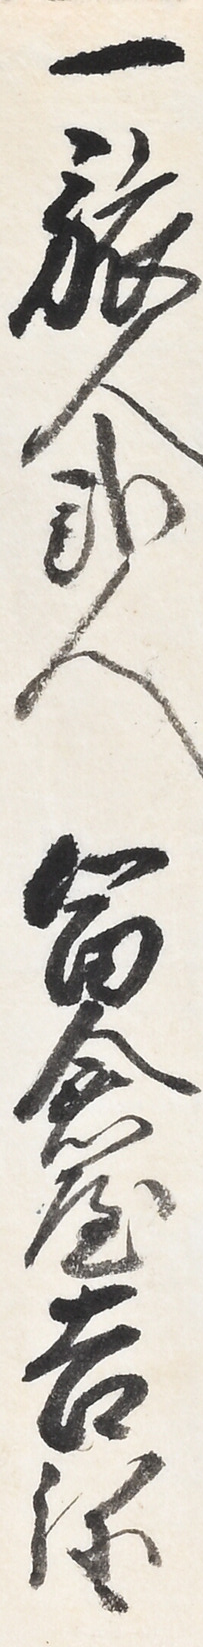一旅人弐人冨倉屋吉弥・
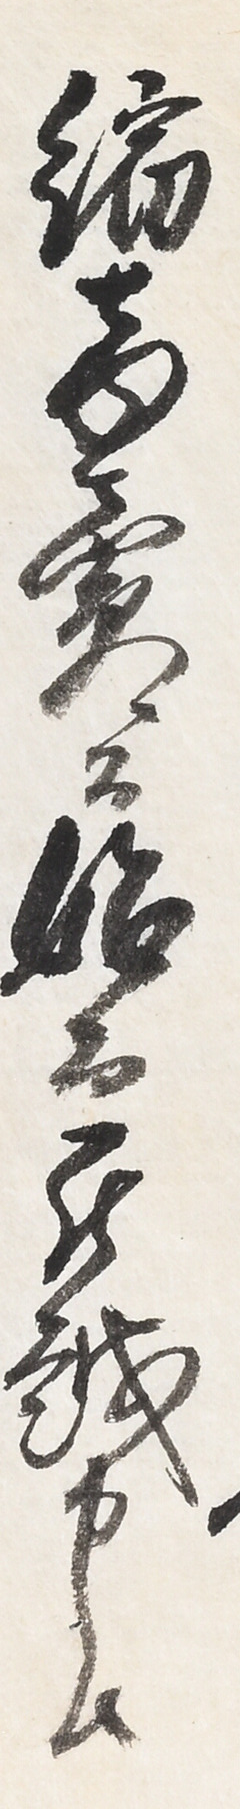縮商売ニ而始而罷越申候
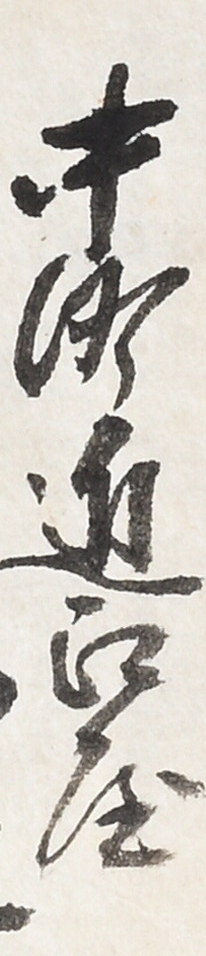中町近江屋
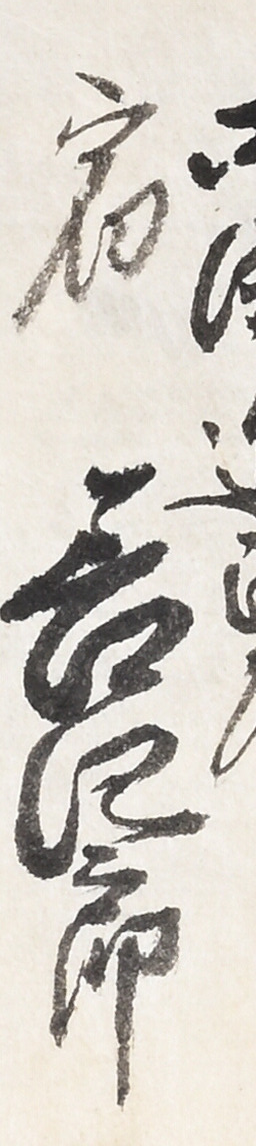宿善四郎
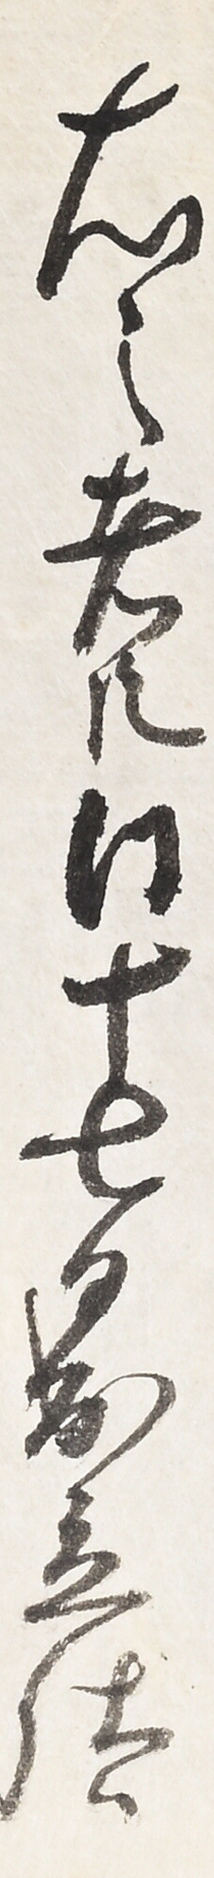右之者共同十七日出立仕候
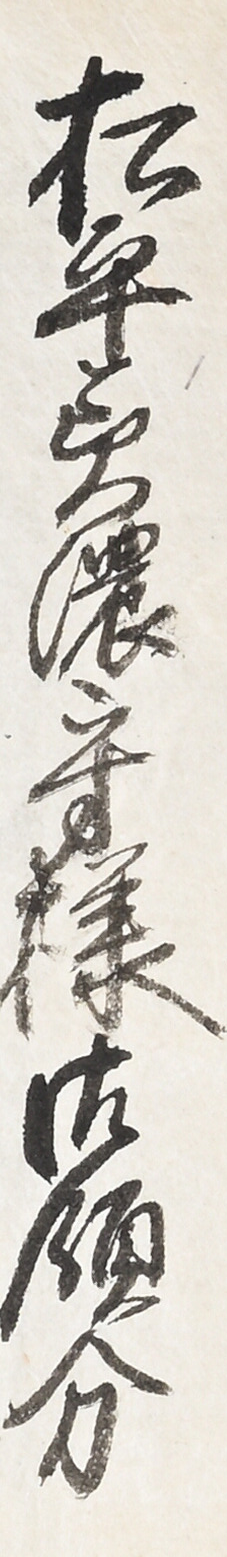松平美濃守様御領分
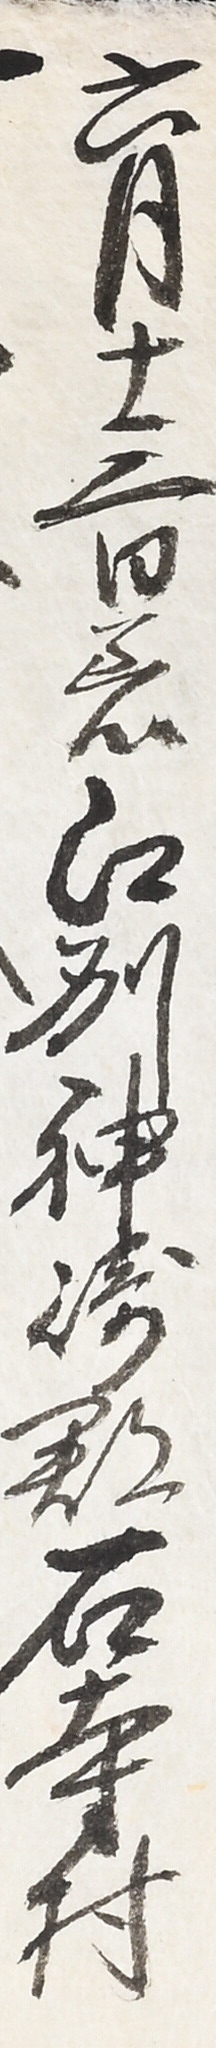六月十三日江州神崎郡石寺村
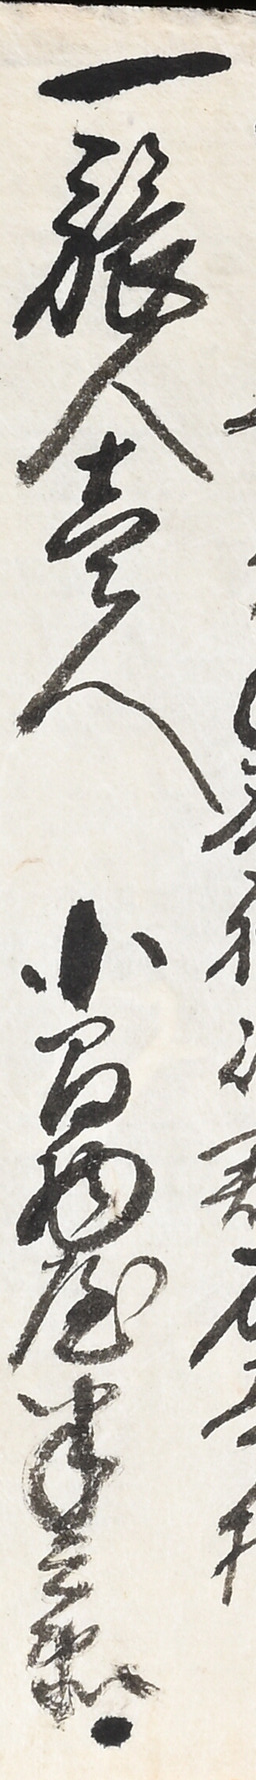一旅人壱人小間物屋半兵衛・
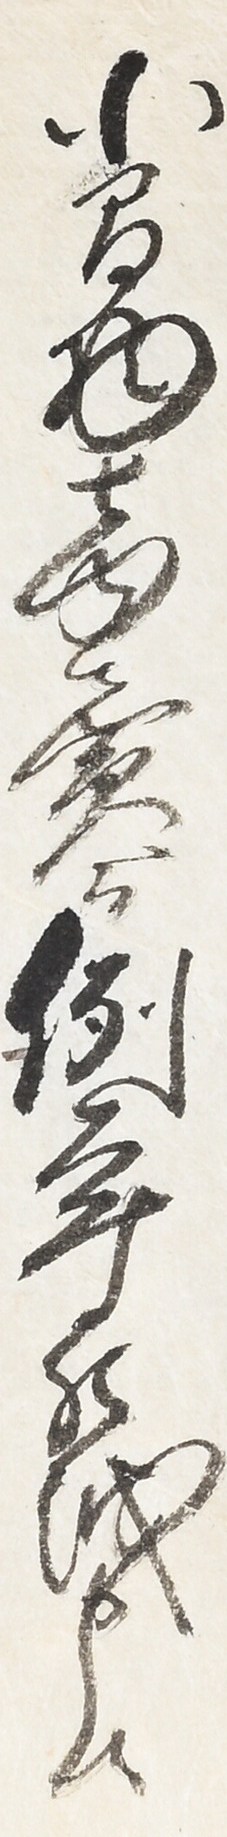小間物商売ニ而例年罷越申候
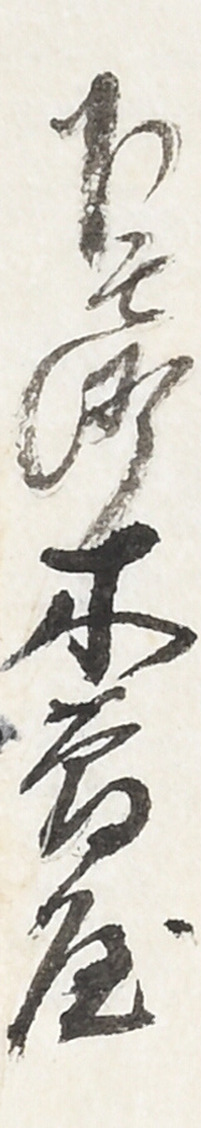下モ町木曽屋
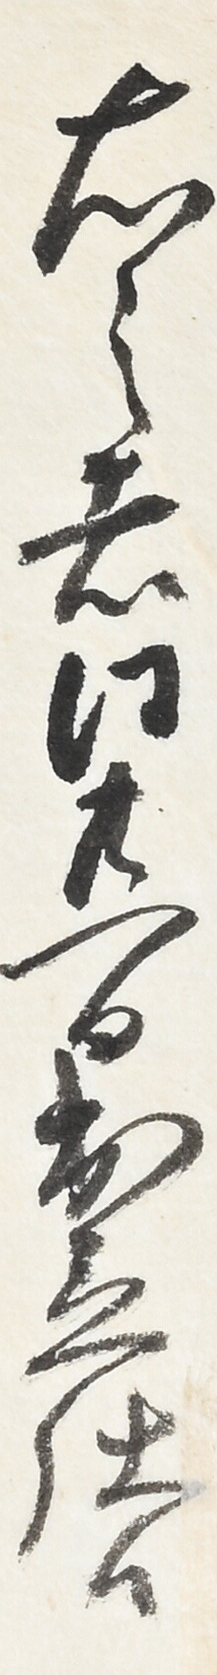右之者同廿一日出立仕候
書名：旅人泊控帳
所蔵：伊那市立高遠町図書館・合同会社AMANE
